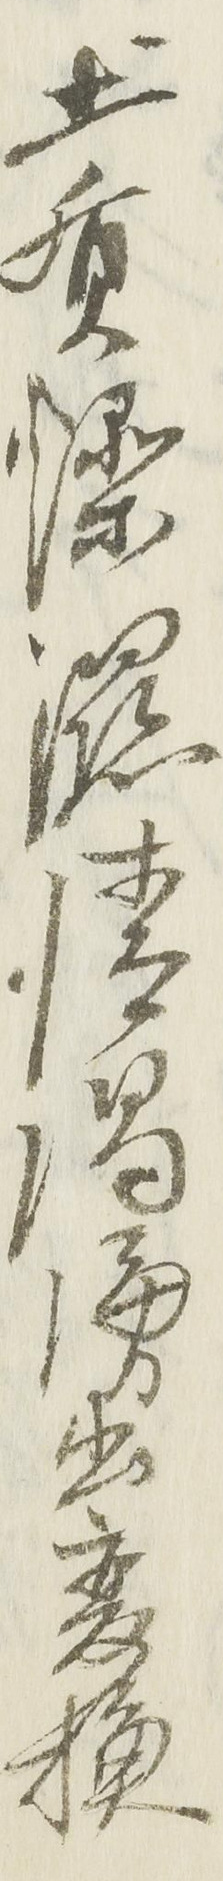土質燥湿清濁湧出変換
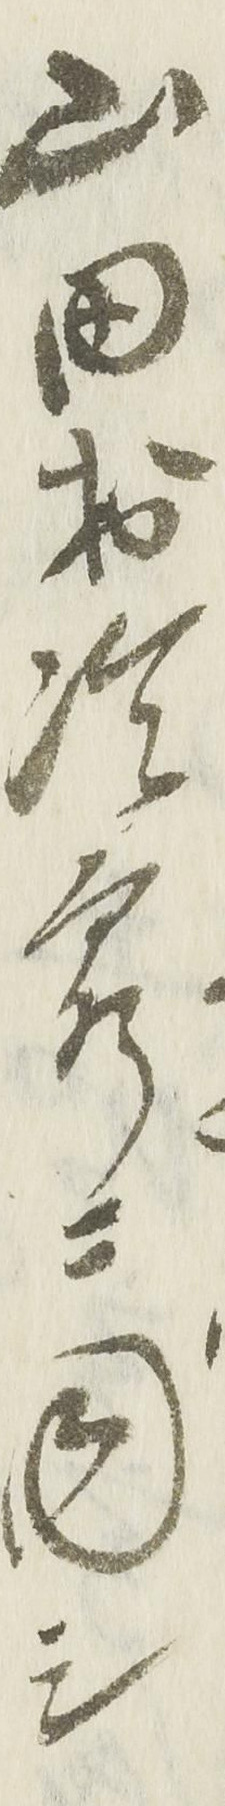山田村冷泉ニ同シ
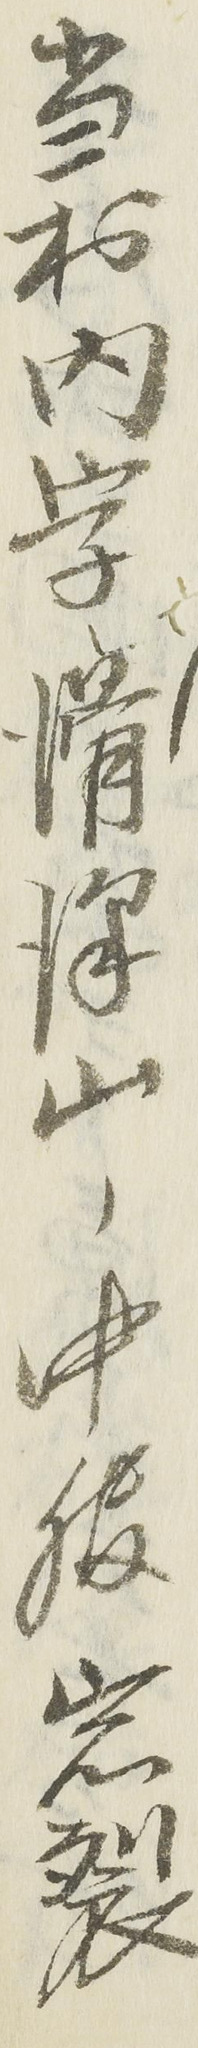当村内字滑沢山ノ中断岩裂

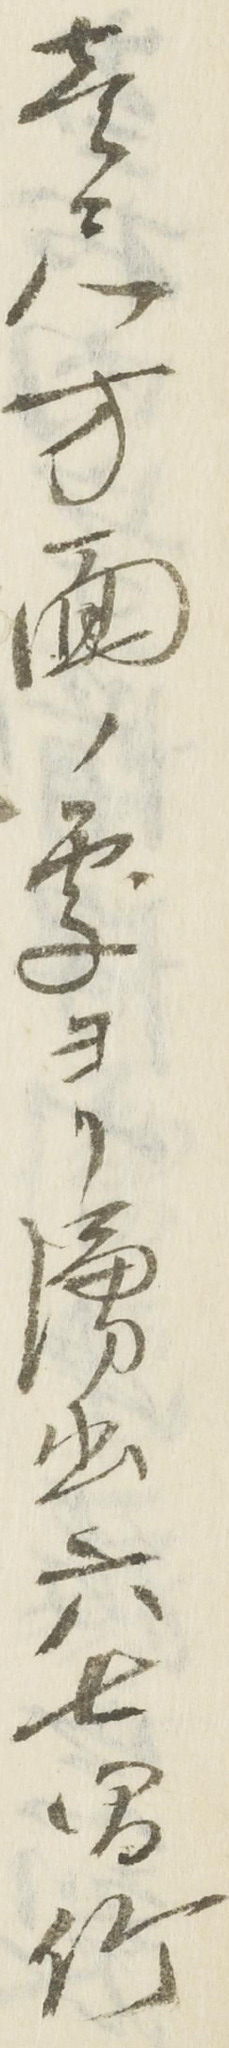壱尺方面ノ処ヨリ湧出六七間竹
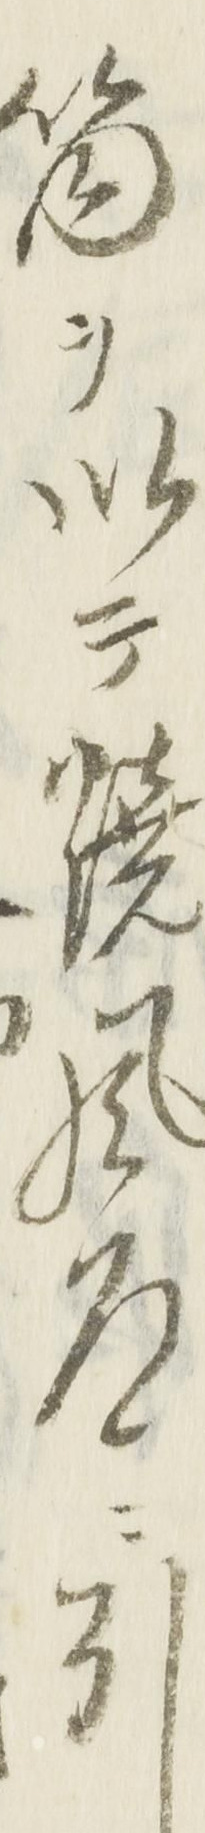筒ヲ以テ焼風呂ニ引
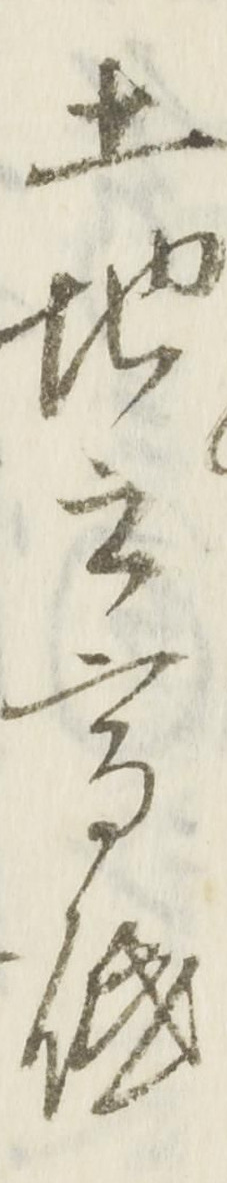土地之高低
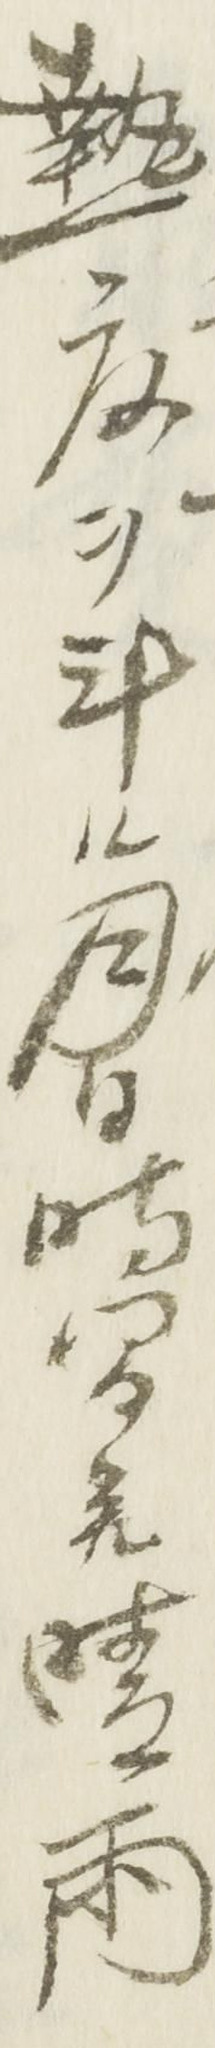熱度ヲ斗ル月日時間幷晴雨
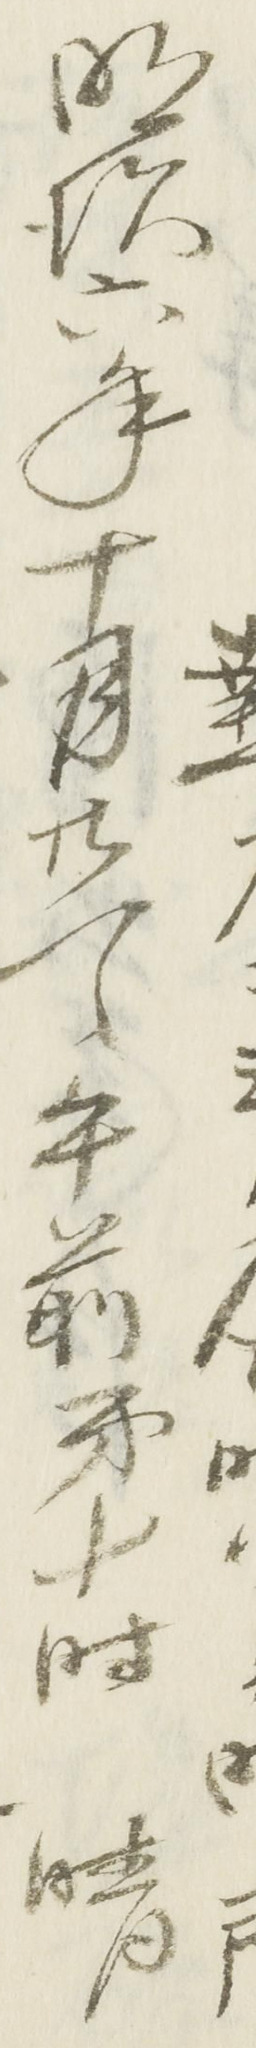明治六年十月廿一日午前第十時晴
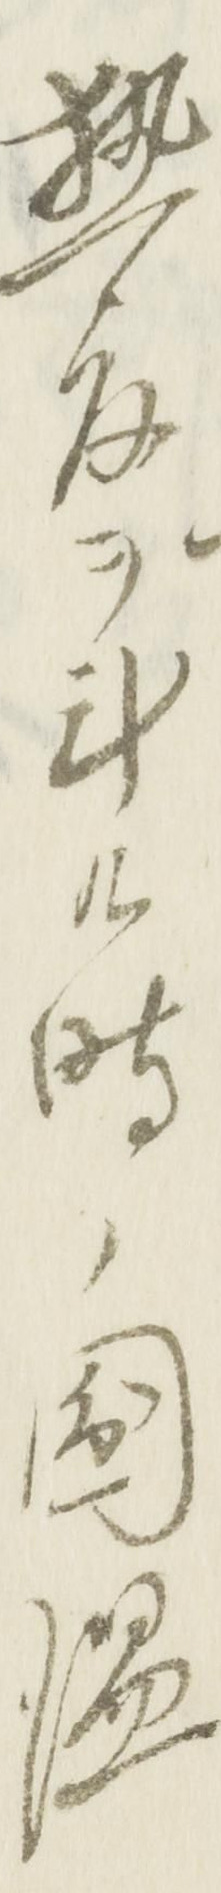熱度ヲ斗ル時ノ分温
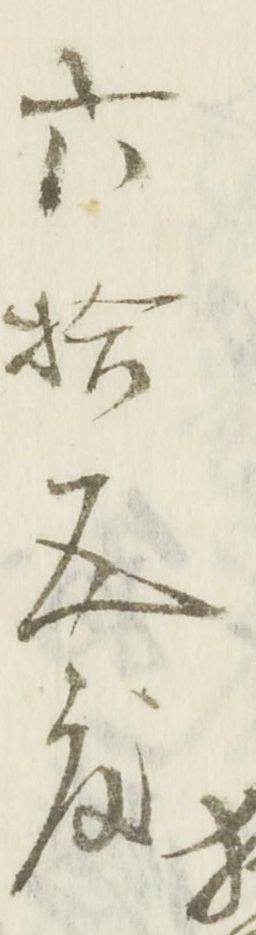六拾五度
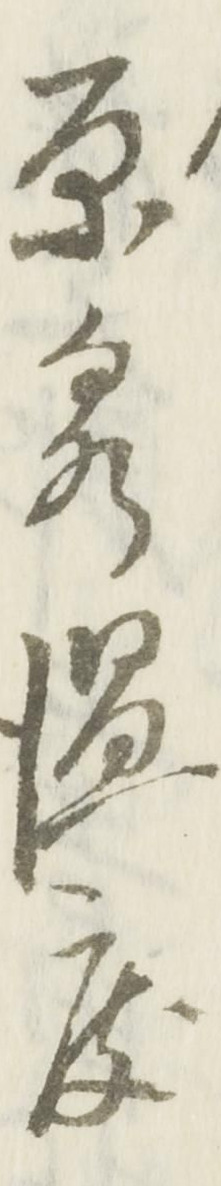原泉温度
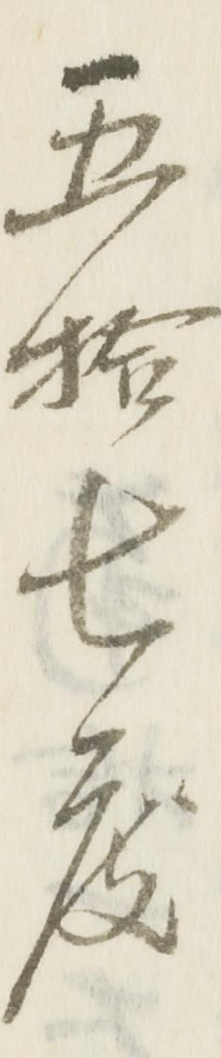五拾七度
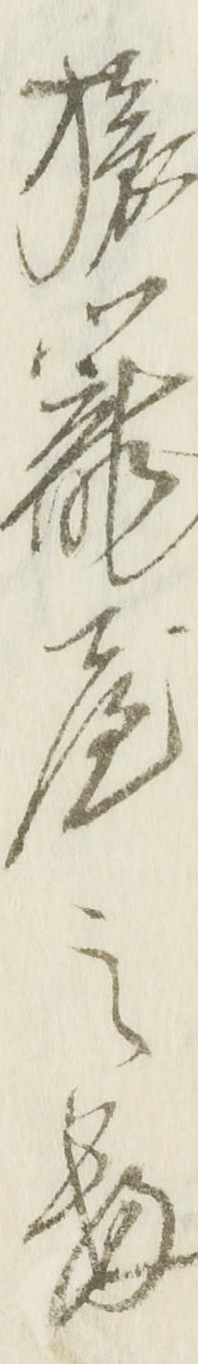旅籠屋之数
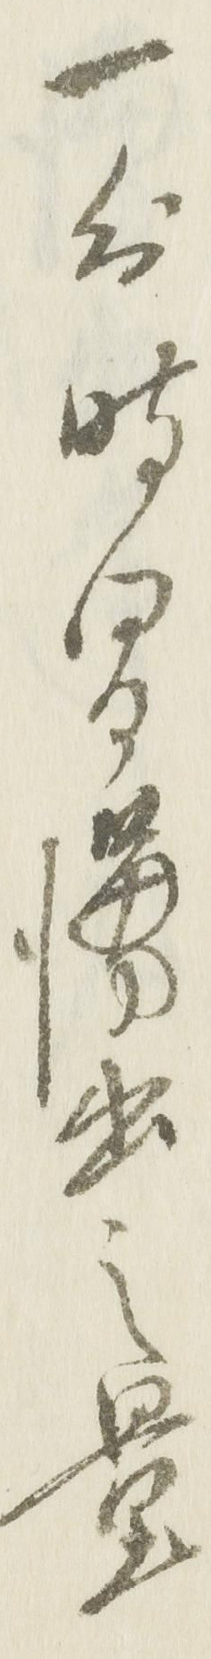一分時間湧出之量
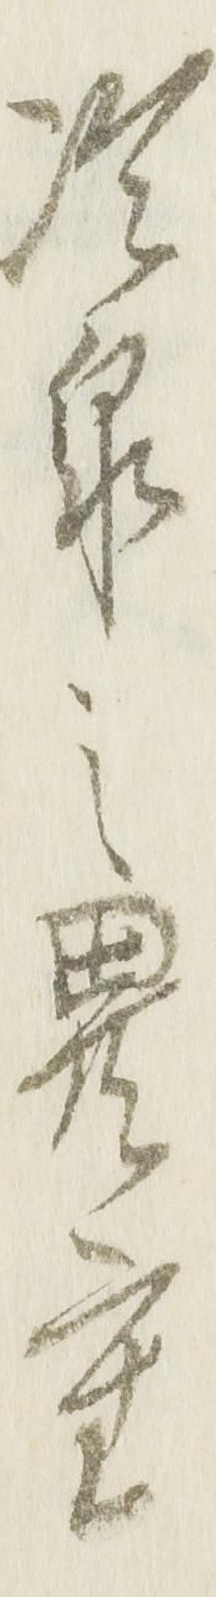冷泉之異重
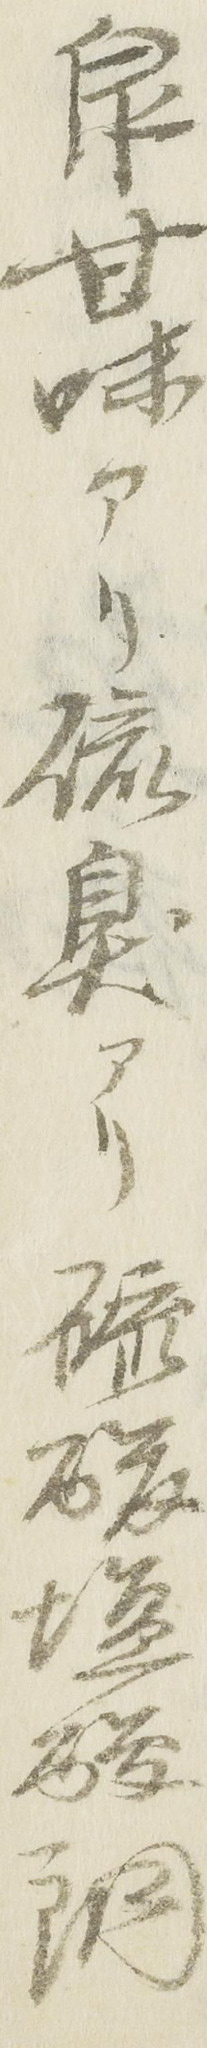泉甘味アリ硫臭アリ硫酸塩酸阻
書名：温冷泉試験表
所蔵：東京大学地震研究所図書室 Earthquake Research Institute Library, The University of Tokyo, JAPAN
